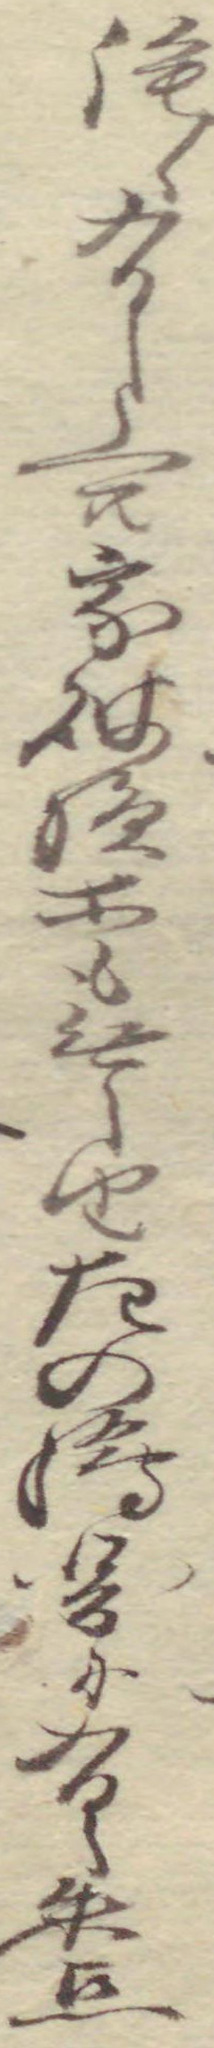強く有之候へ共家破損等も無之由左の絵図に有之朱点
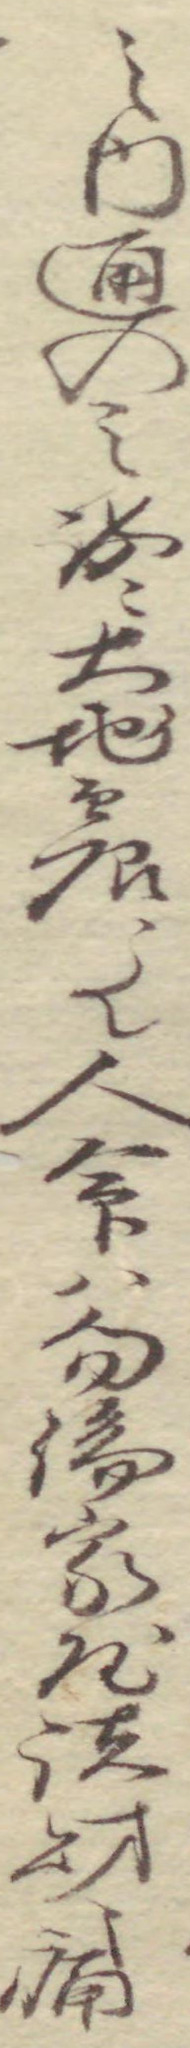之内通のミ誠ニ大地震にて人命ハ勿論家屋諸財之痛
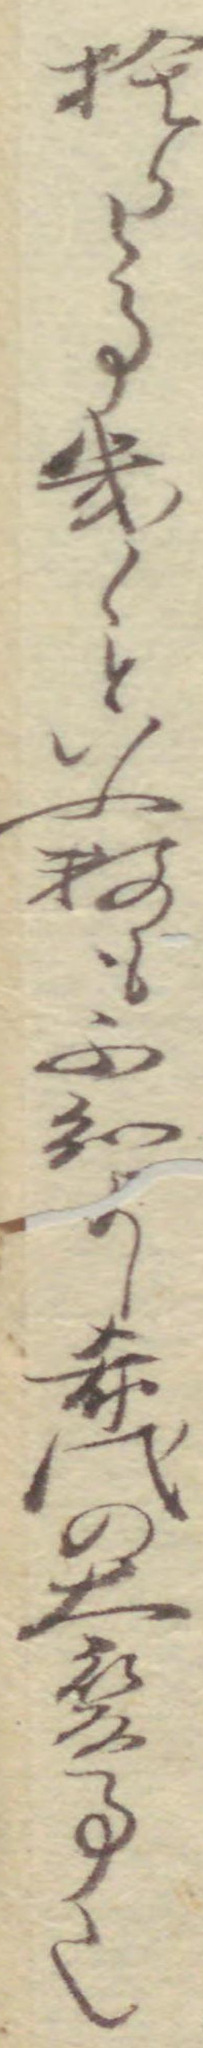捨たること事幾〳〵といふ数も不知よし希代の大変事也

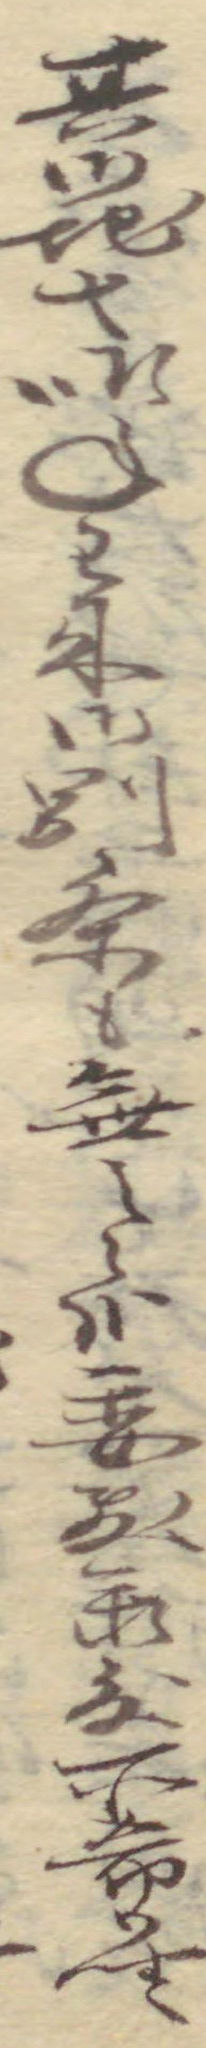其御地は昨年已来御別条も無之候哉委敷承度所希御座候
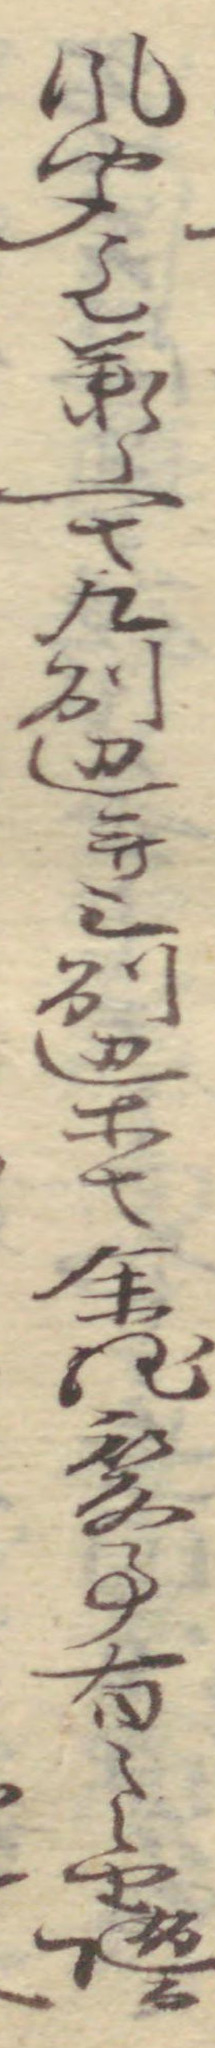風聞ニて承候へ共九州辺幷三州辺等は余程変事有之候由随て
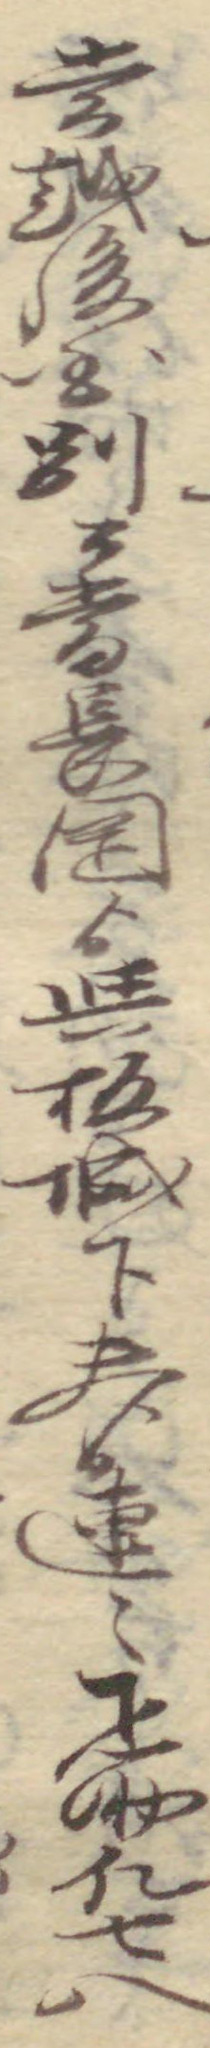当越後国別て当長岡ゟ与板城下夫ゟ連〻下筋凡七八
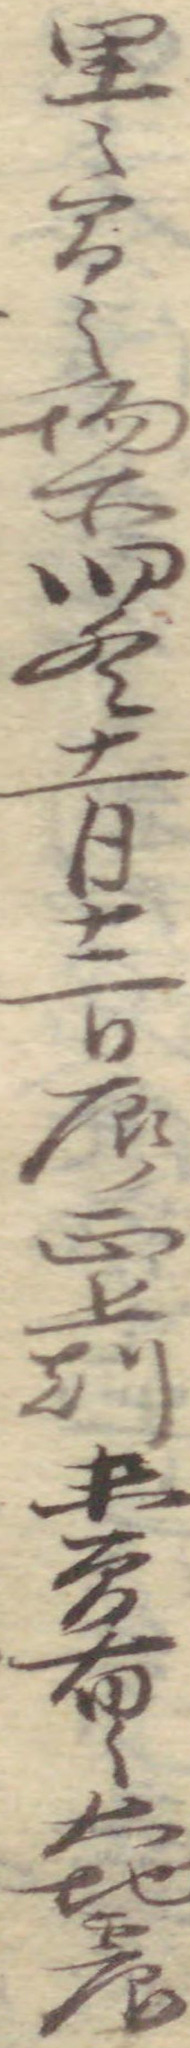里之間之場所旧冬十一月十二日辰ノ正上刻未曽有之大地震
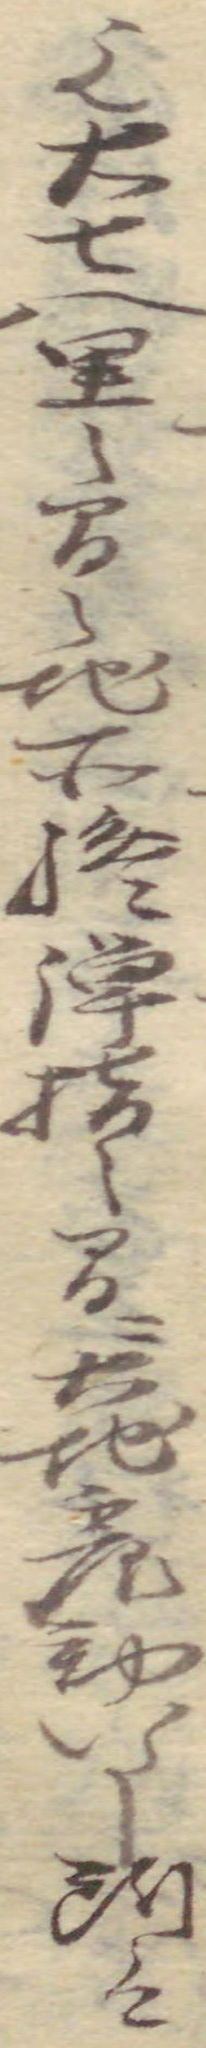ニて右七八里之間地所纔弾指之間ニ大地震動いたし所〻
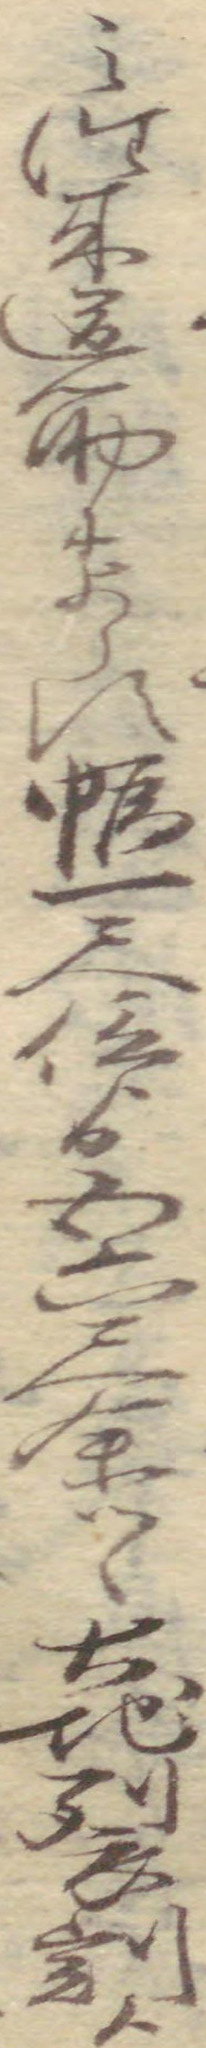之往来道筋によらす幅一尺位ゟ五六尺余ツヽ大地裂割候
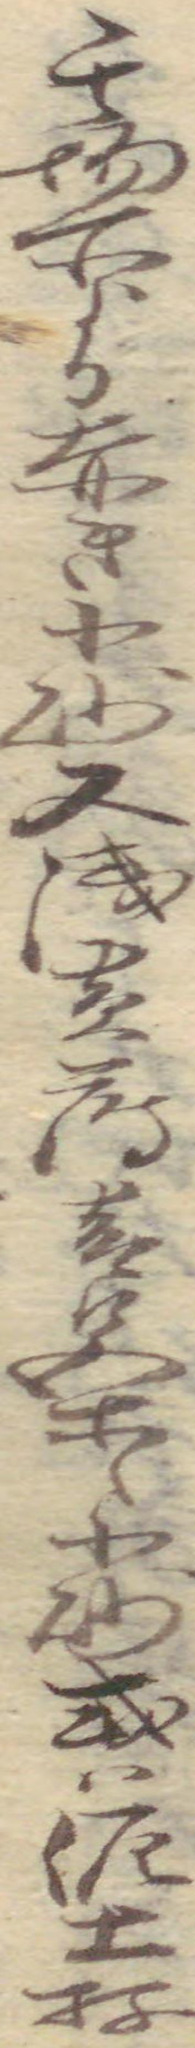其場所より赤き小砂又浅黄薄青色等之小砂或ハ泥土抔
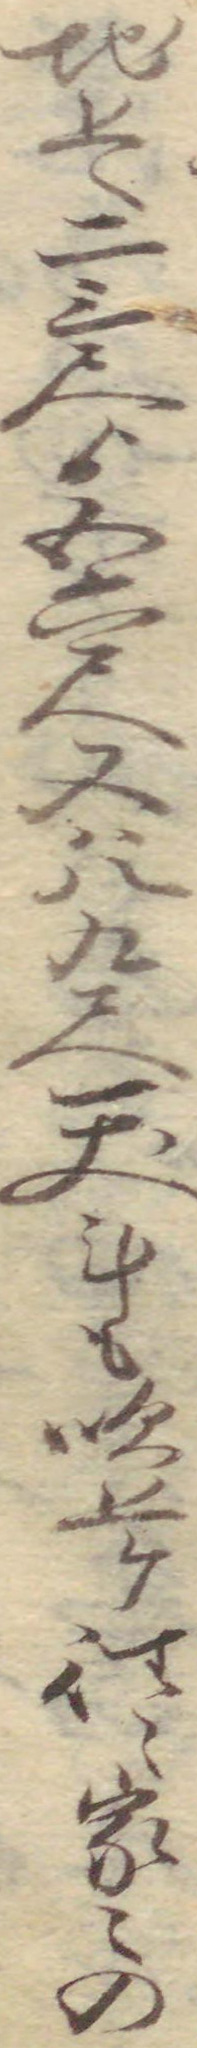地上へ二三尺ゟ五六尺又ハ八九尺一丈計も吹上ケ徃〻家〻の
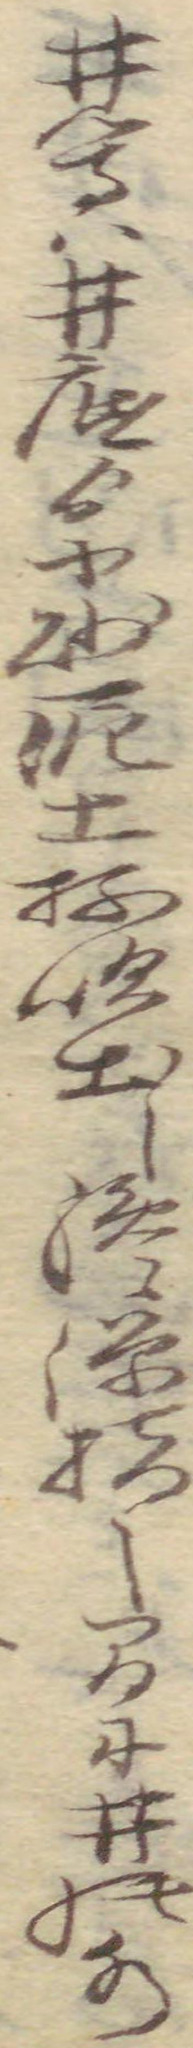井等ハ井底ゟ小砂泥土抔吹出し纔弾指之間に井の水
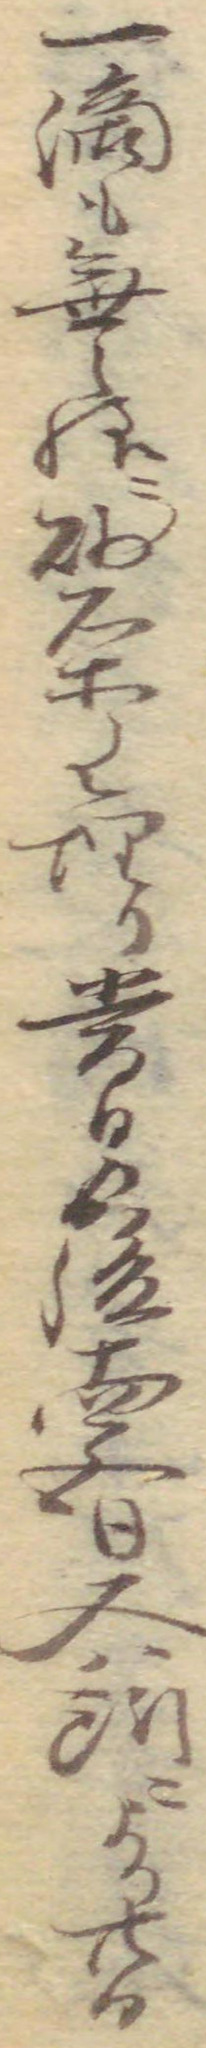一滴も無之様ニ砂石等ニて埋り当日ゟ後十四五日又ハ所ニより廿日

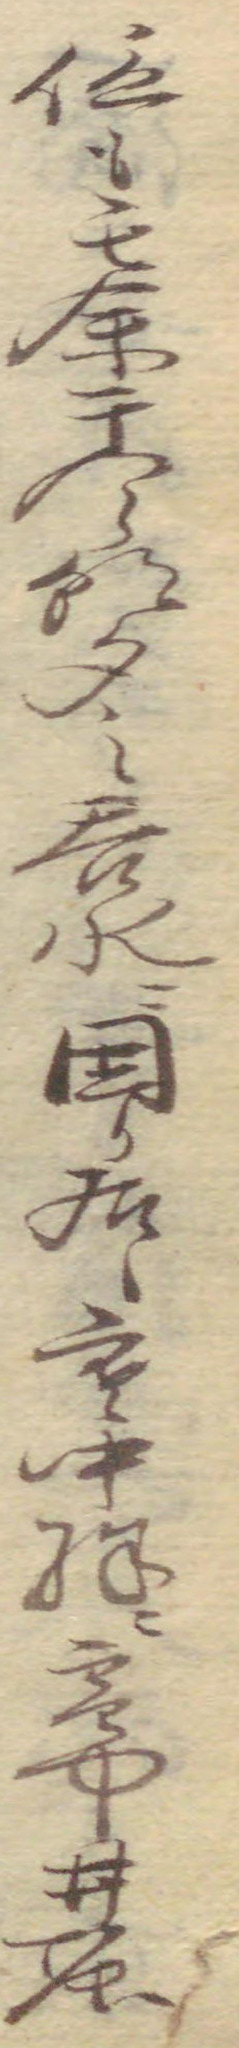位も其余爾今朝夕之呑水ニ困り居り候寒中殊ニ寒中井堀
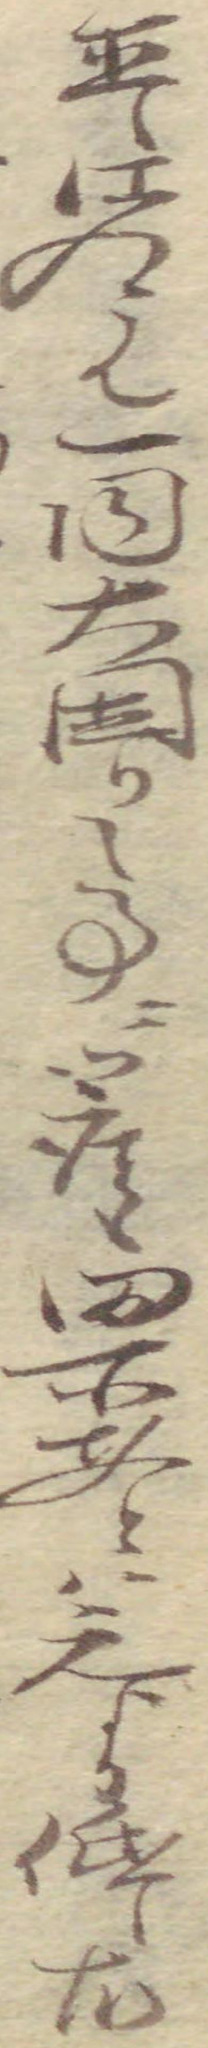直候仕合ニ也一同大困り之事ニ御座候田所なとハ元より低候故
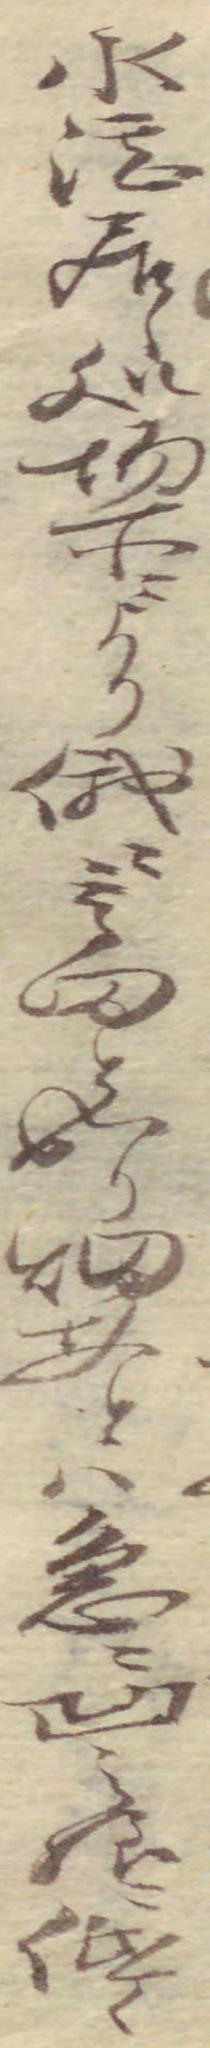水湛居候処傾所ニより俄ニ高田と成り畑なとハ急ニ凹之様ニ低く
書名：鶯宿雑記. 巻199-200
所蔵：国立国会図書館 National Diet Library, JAPAN
